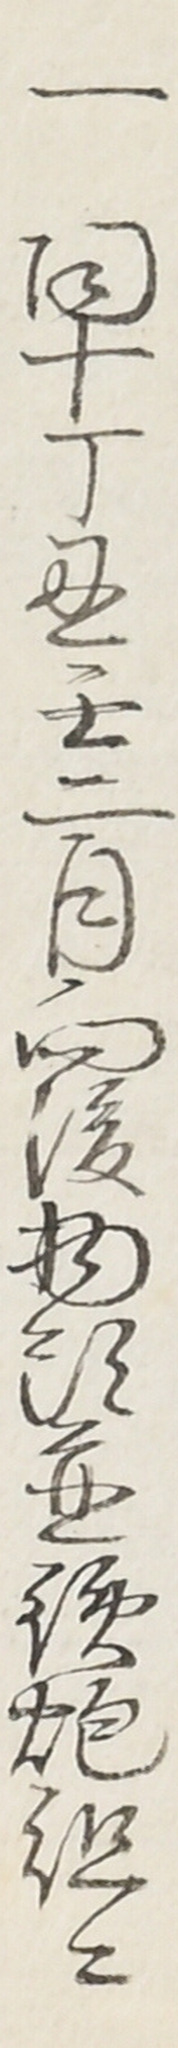一同十丁丑閏二月向後物頭並鉄炮組ニ
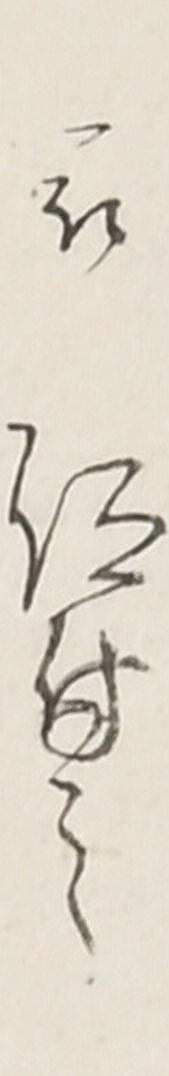被仰付之
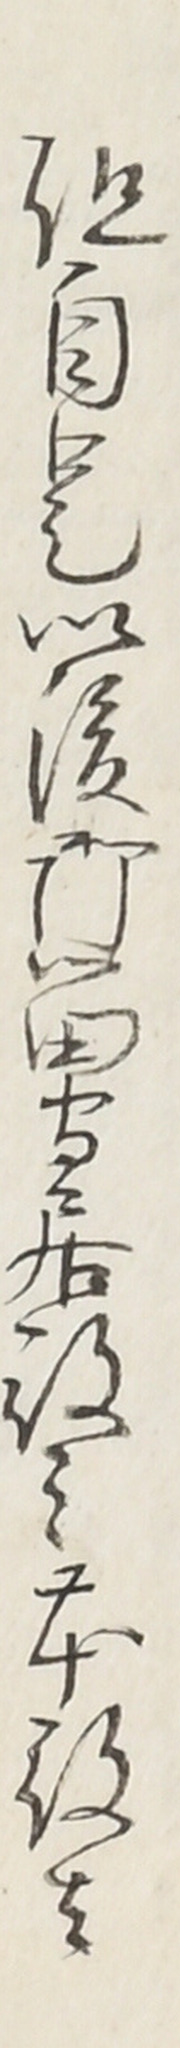但自是以後御留守居役之本役は
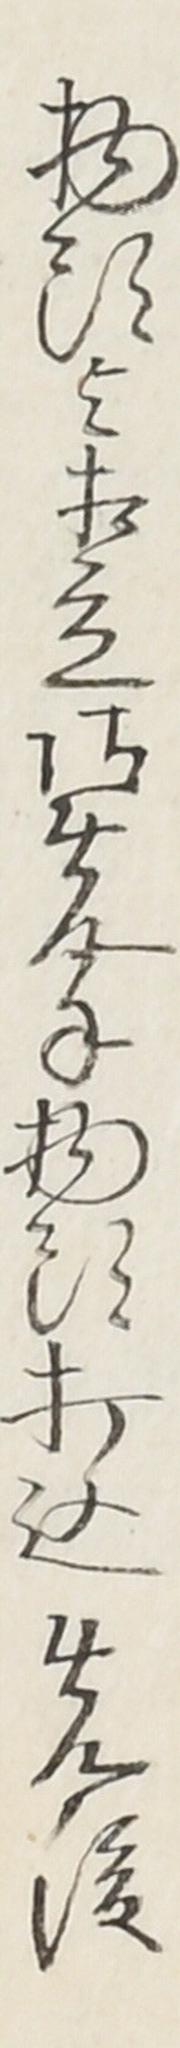物頭と相立御先手物頭打込先後
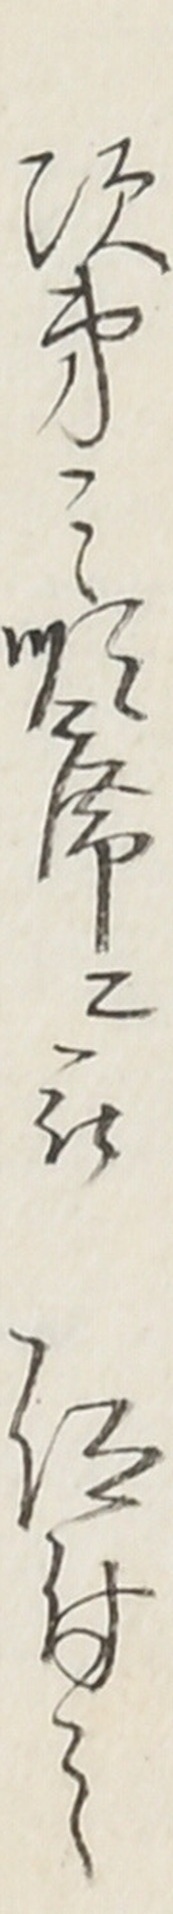次第之順席ニ被仰付之
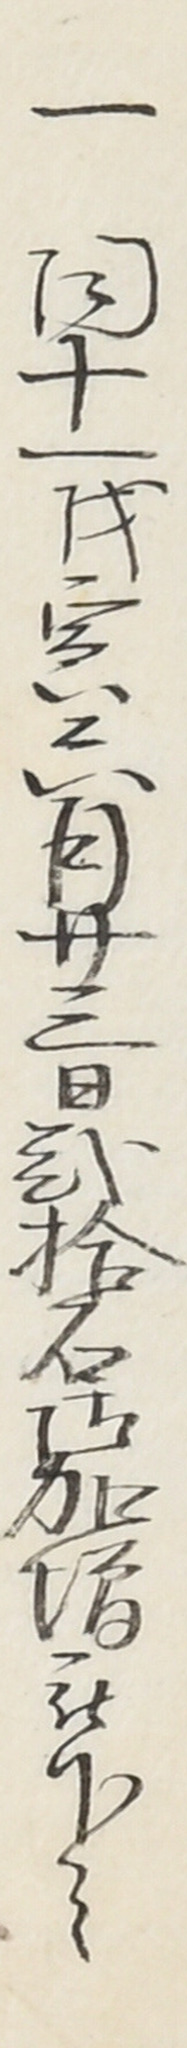一同十一戊寅六月廿三日弐拾石御加増被下之
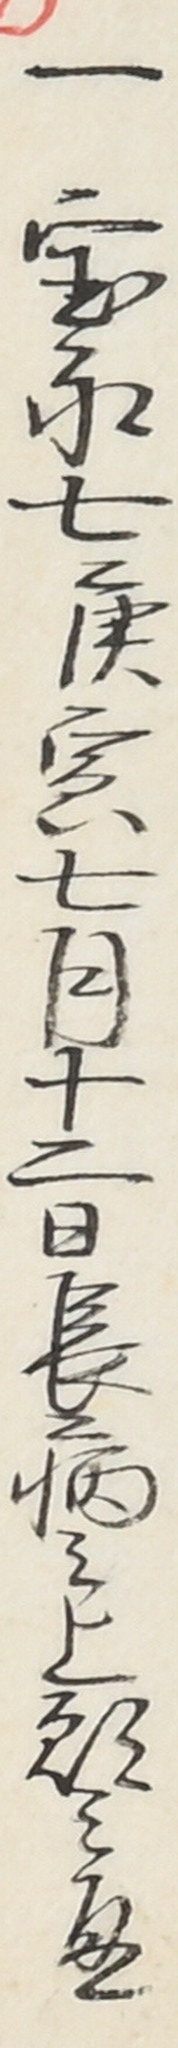一宝永七庚寅七月十二日長病之上願之通

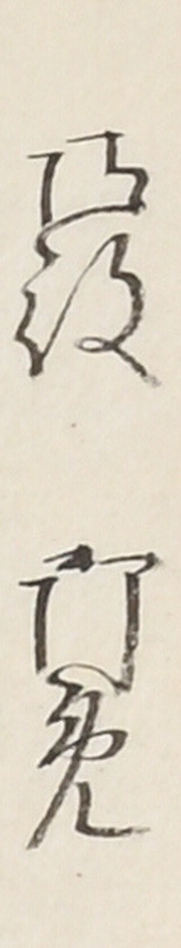御役御免
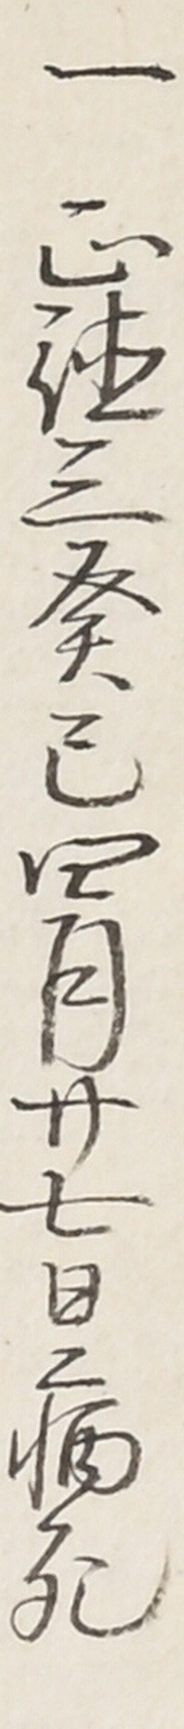一正徳三癸巳四月廿七日病死
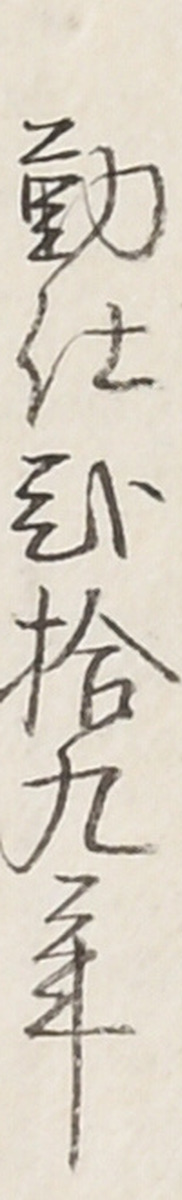勤仕弐拾九年
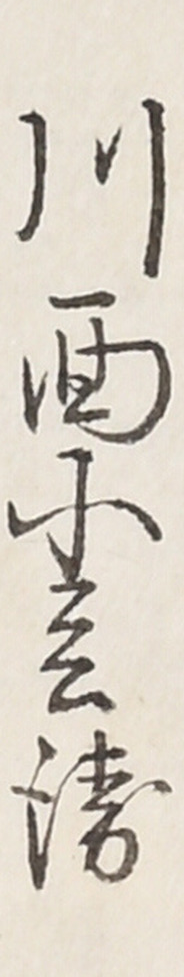川西小兵衛
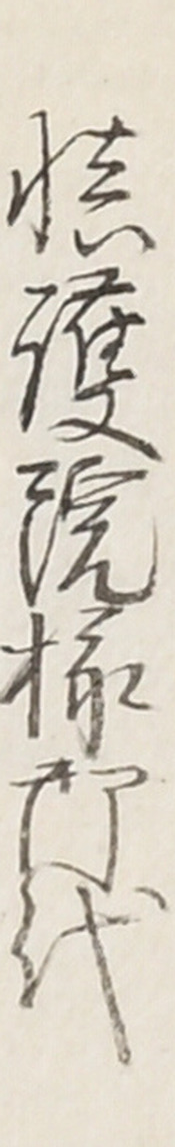慎護院様御代
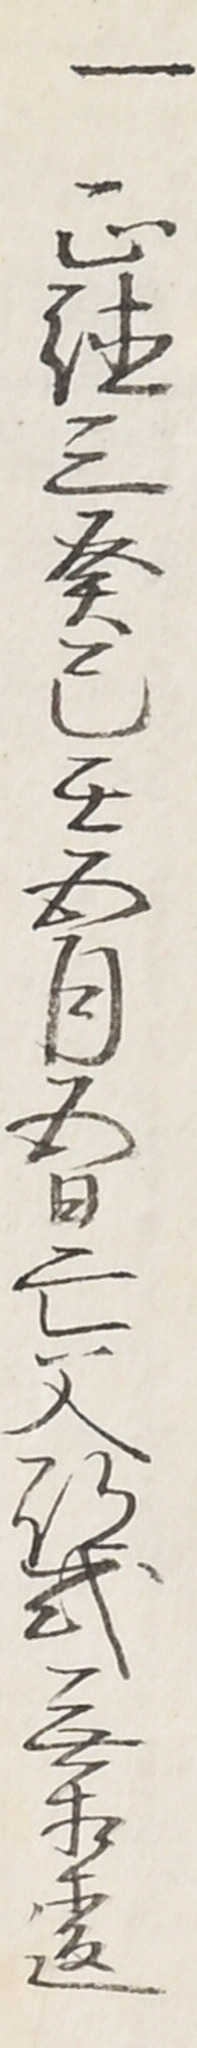一正徳三癸巳閏五月五日亡父跡式無相違
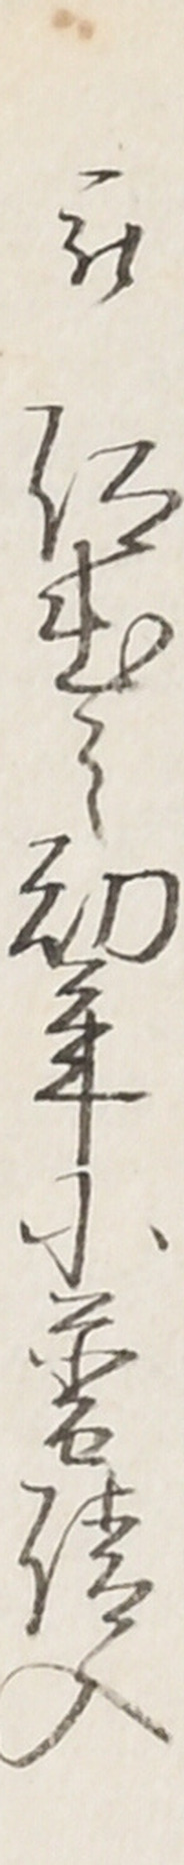被仰出之幼年小普請入
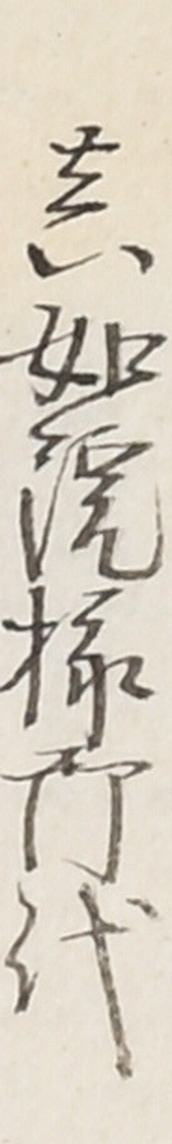真如院様御代
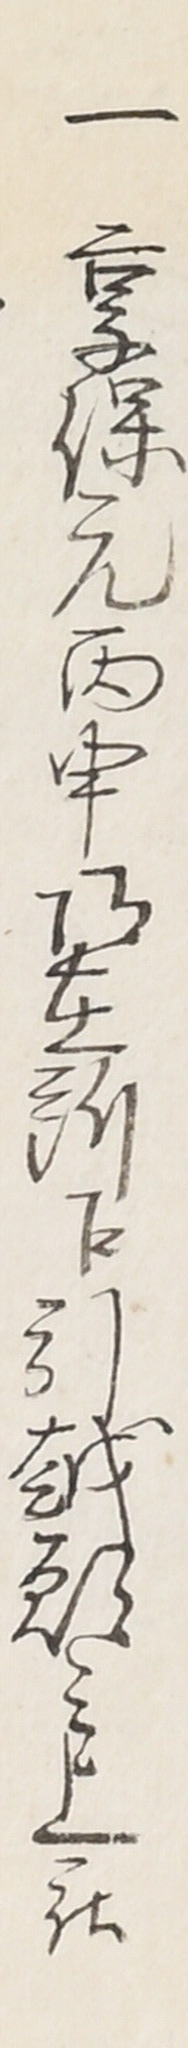一享保元丙申御在所江引越願之上被
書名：給人諸士勤仕録（七）
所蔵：伊那市立高遠町図書館・合同会社AMANE
